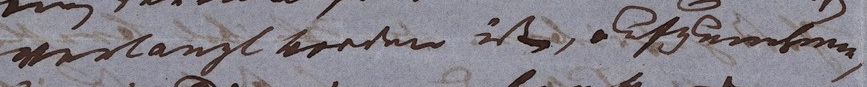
verlangt worden ist, aufzunehmen,
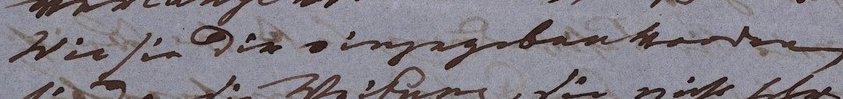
wie sie Dir eingegeben worden
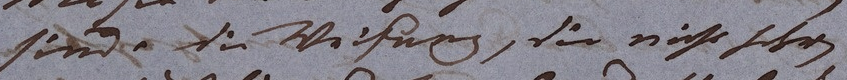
sind. Die Weisung, die nicht sehr
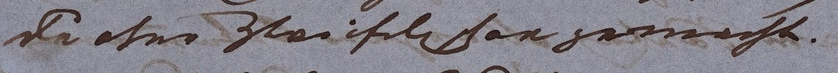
Du ohne Zweifel schon gemacht.
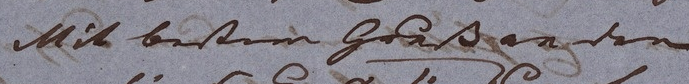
Mit bestem Gruß an den
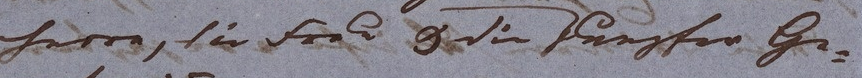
Herrn, die Frau & die Jungfer Ge-
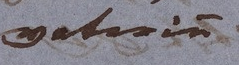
vaterinn
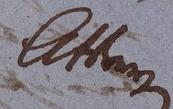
Bern
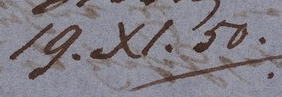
19. XI. 50
